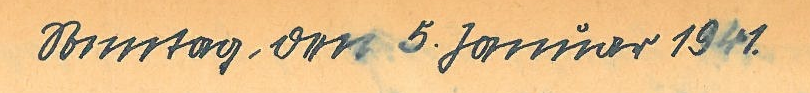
Sonntag, den 5. Januar 1941.
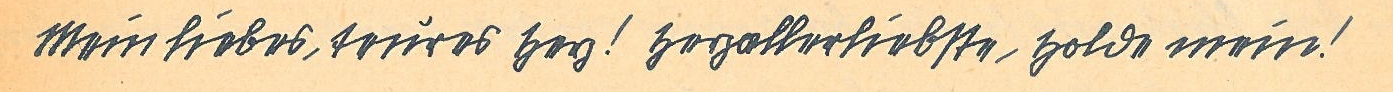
Mein liebes, teures Herz! Herzallerliebste, Holde mein!
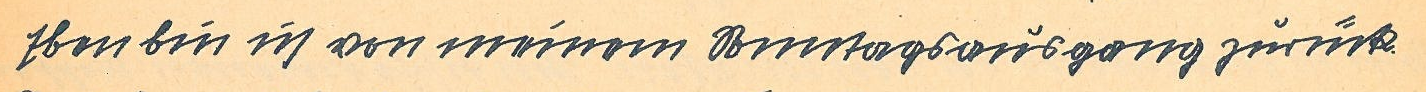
Eben bin ich von meinem Sonntagsspaziergang zurück.
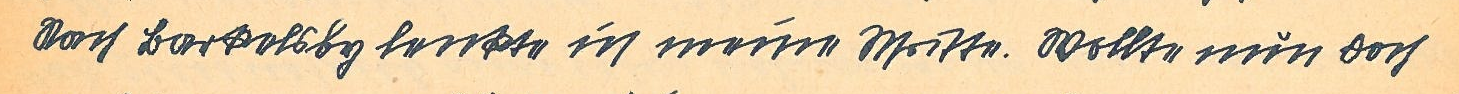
Nach B. lenkte ich meine Schritte. Wollte nun doch
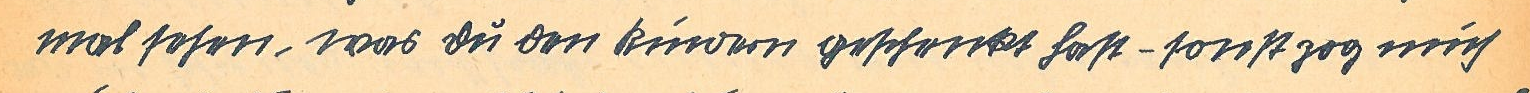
mal sehen, was Du den Kindern geschenkt hast – sonst zog mich
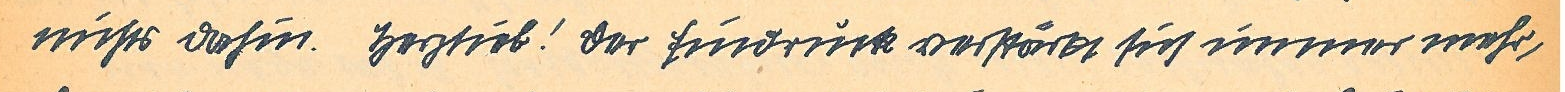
nichts dahin. Herzlieb! Der Eindruck verstärkt sich immer mehr,
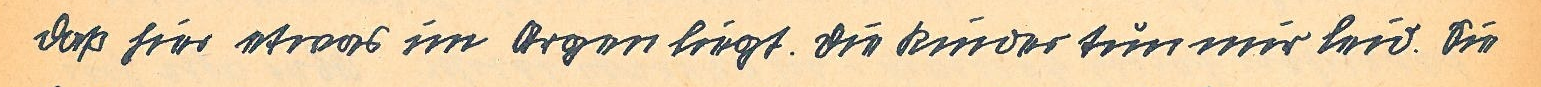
daß hier etwas im Argen liegt. Die Kinder tun mir leid. Sie
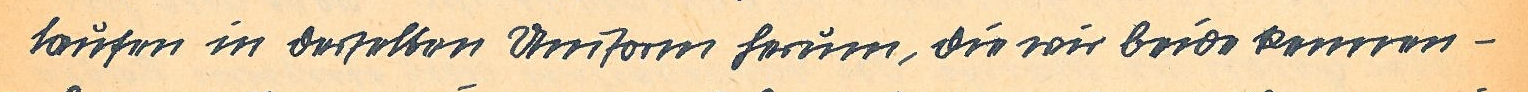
laufen in derselben Uniform herum, die wir beide kennen –
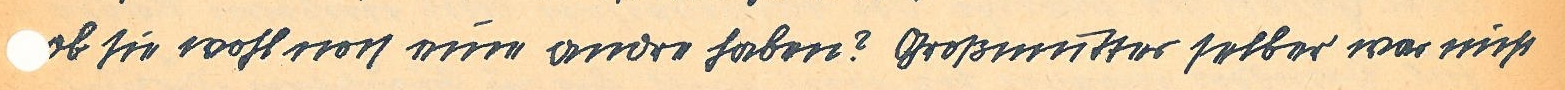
ob sie wohl noch eine andre haben? Großmutter selber war nicht
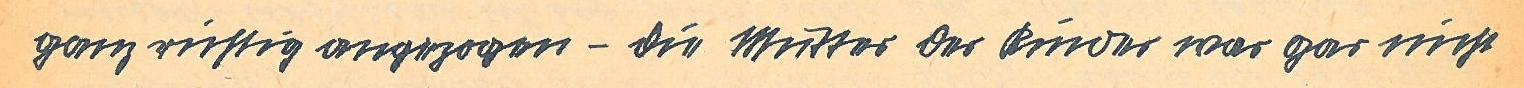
richtig angezogen – die Mutter der Kinder war gar nicht
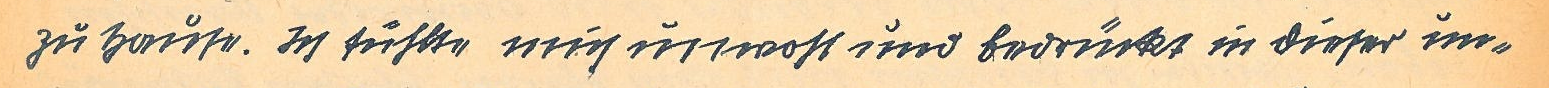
zu Hause. Ich fühlte mich unwohl und bedrückt in dieser un¬
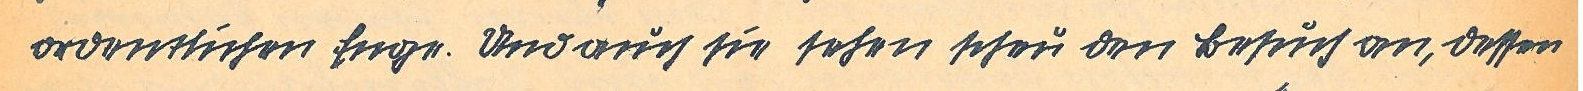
ordentlichen Enge. Und auch sie sehen scheu den Besuch an, dessen
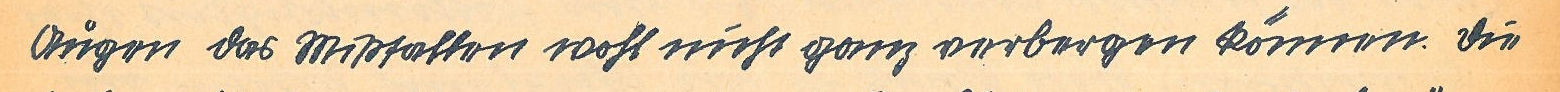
Augen das Mißfallen wohl nicht ganz verbergen können. Die
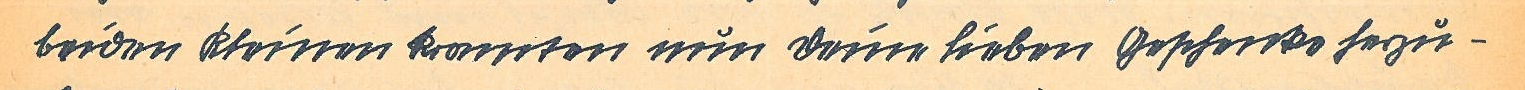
beiden Kleinen kramten nun Deine lieben Geschenke herzu –
